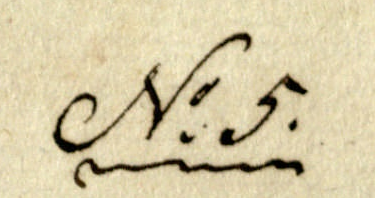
Nº5.
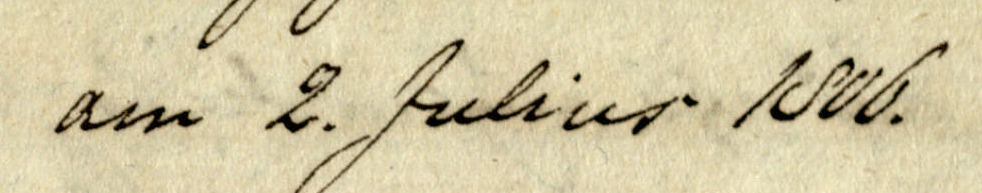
am 2. Julius 1806.
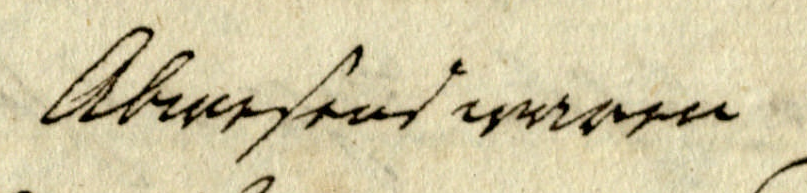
Abwesend waren
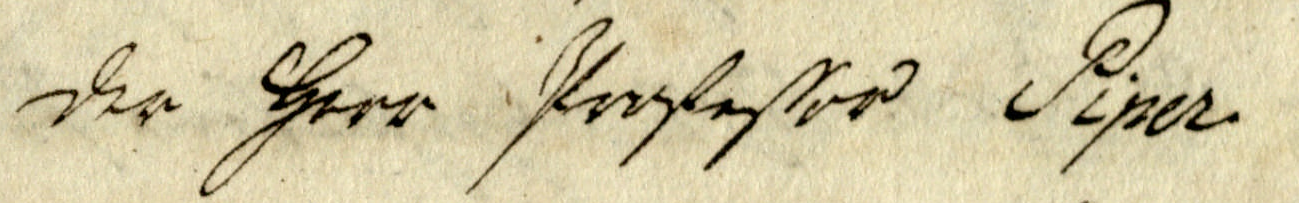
der Herr Professor Piper.
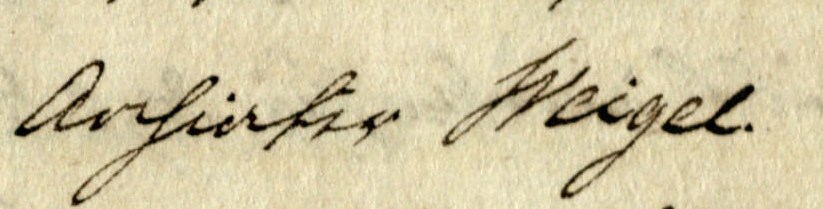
Archiater Weigel.
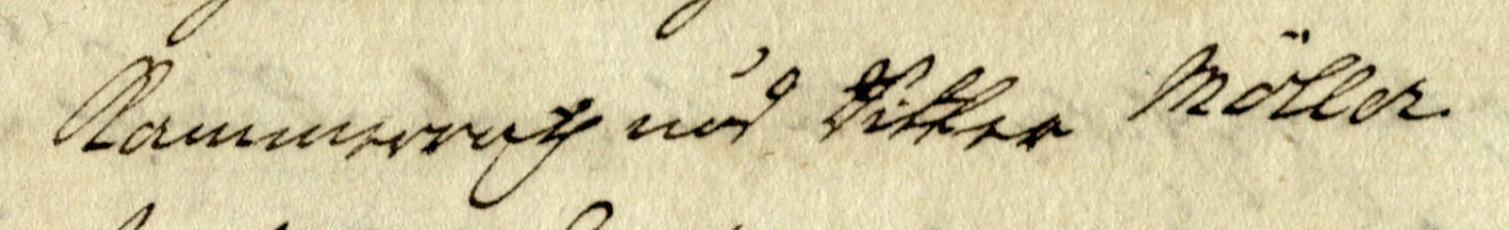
Kammerrath und Ritter Möller.
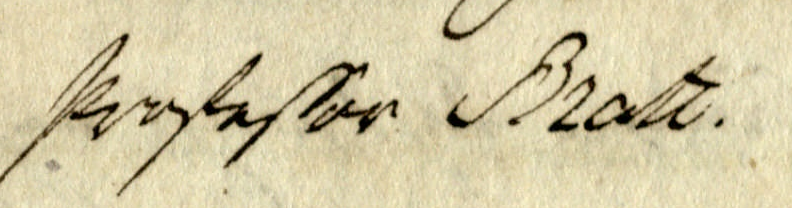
Professor Bratt.
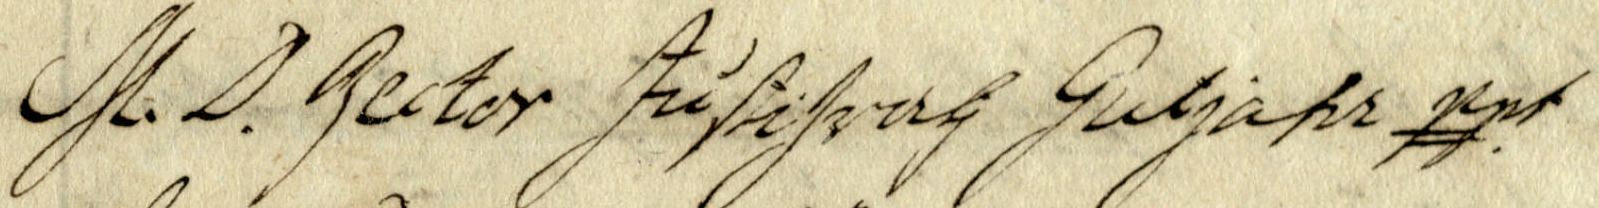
M. D. Rector Justizrath Gutjahr ppt.
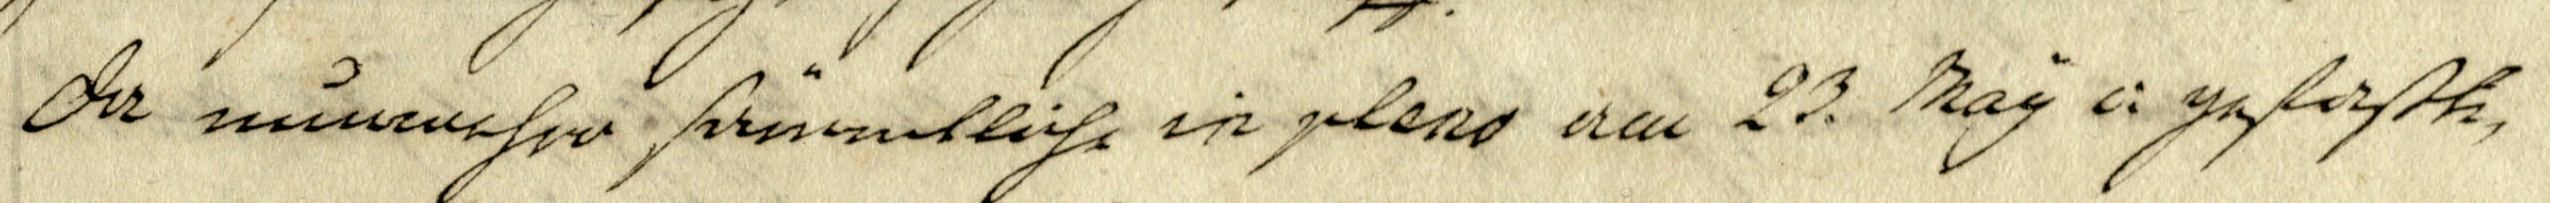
Da nunmehr sämmtliche in pleno am 23. Maÿ c. gefaßte,
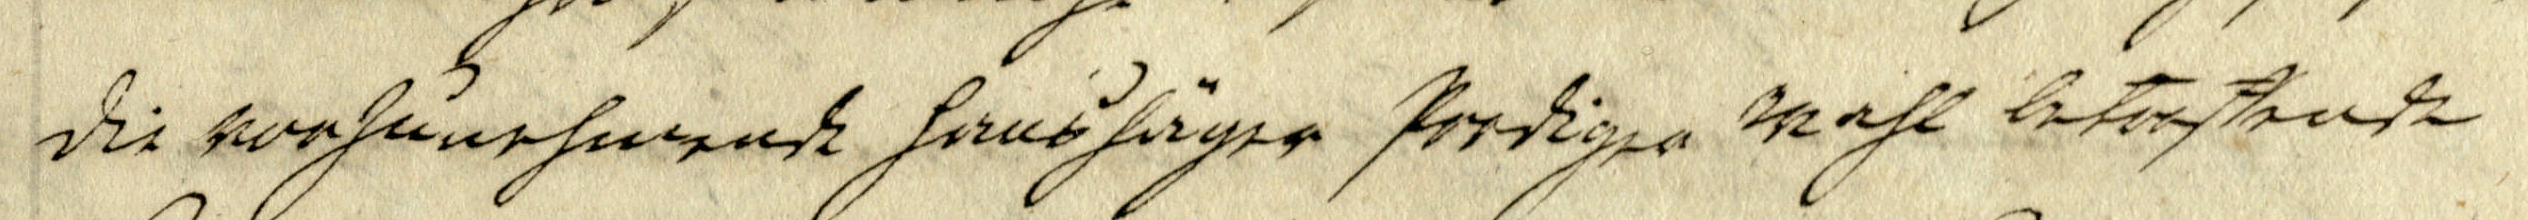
die vorzunehmende hanshäger Prediger wahl betreffenden
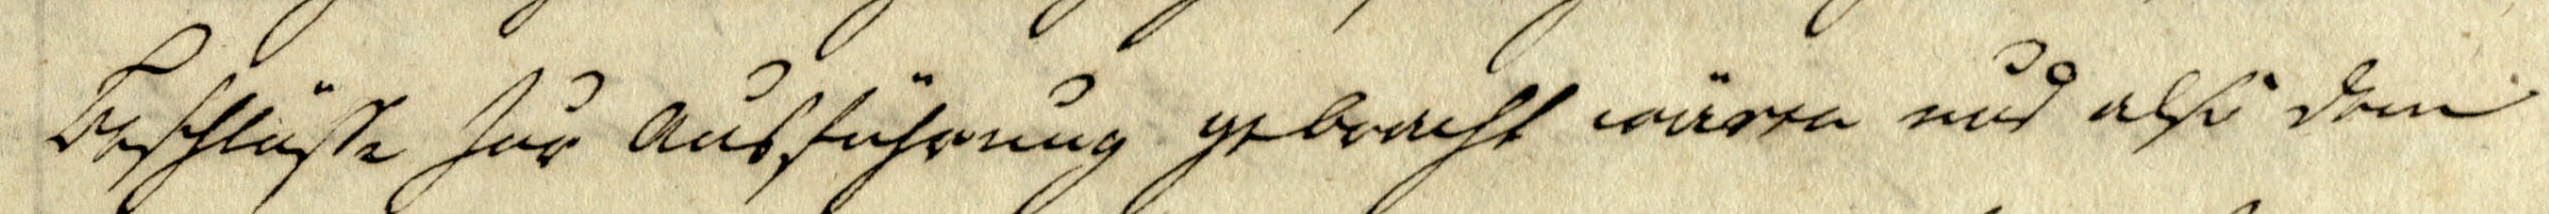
Beschlüsse zur Ausführung gebracht wären und also dem
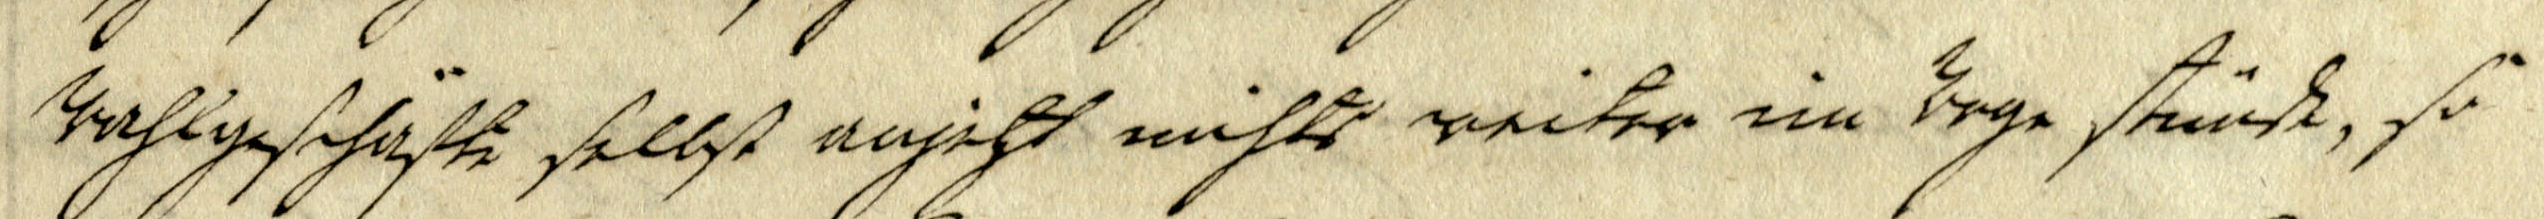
Wahlgeschäfte selbst anjetzt nichts weiter im Wege stünde, so
